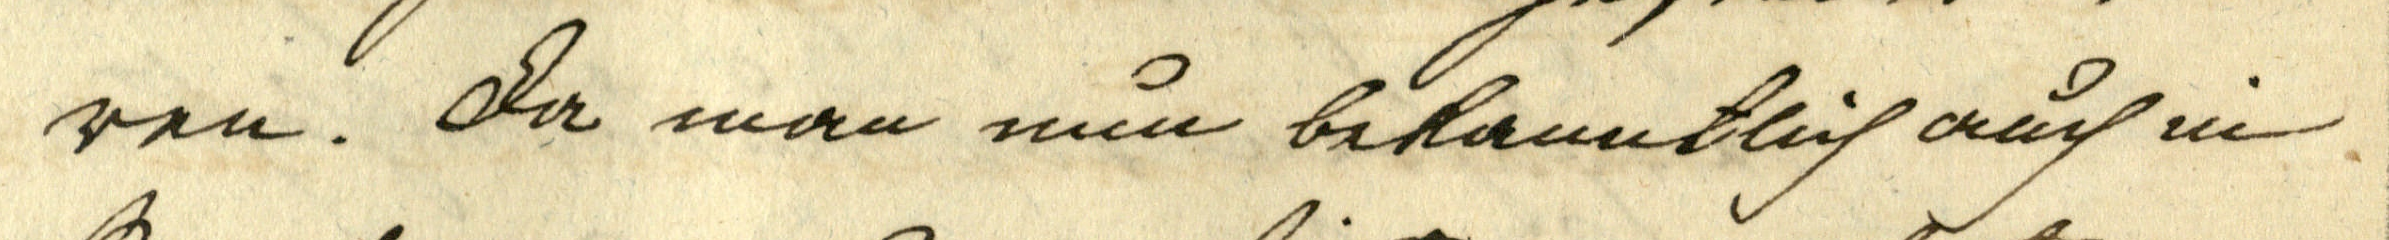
ren. Da man nun bekanntlich auch in
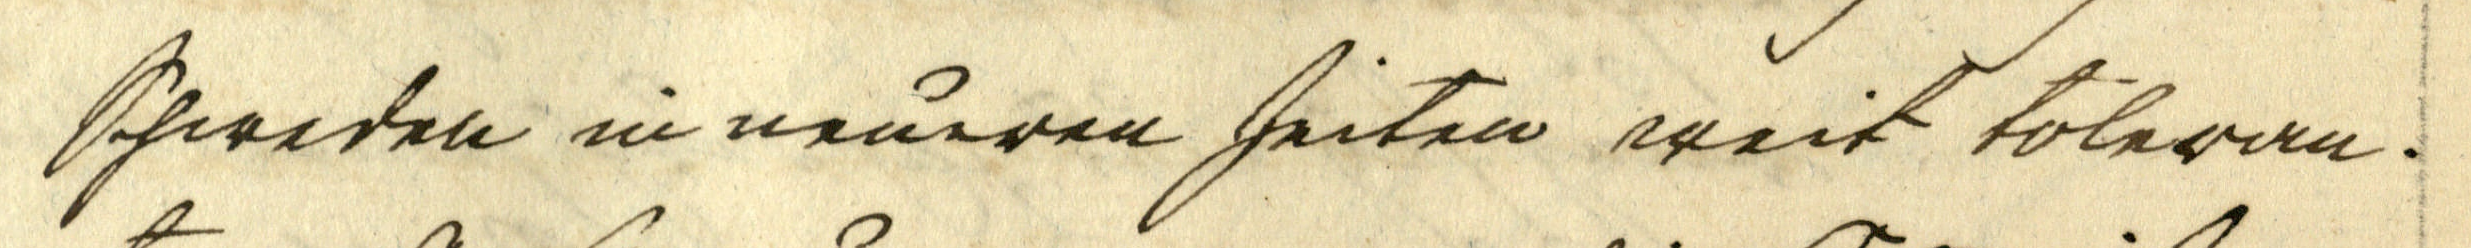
Schweden in neueren Zeiten weit toleran¬
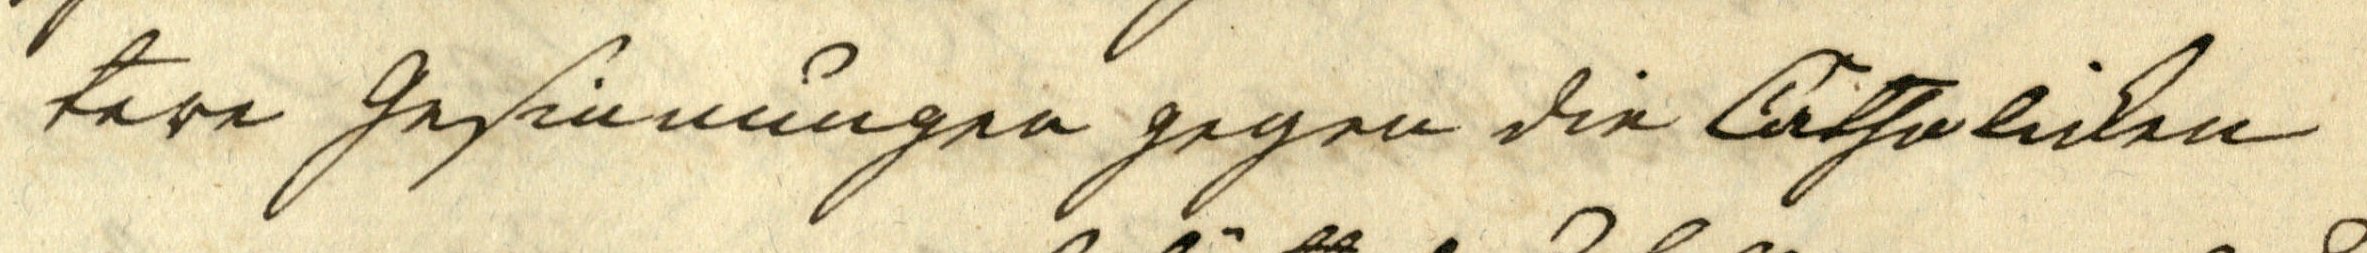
tere Gesinnungen gegen die Catholicken
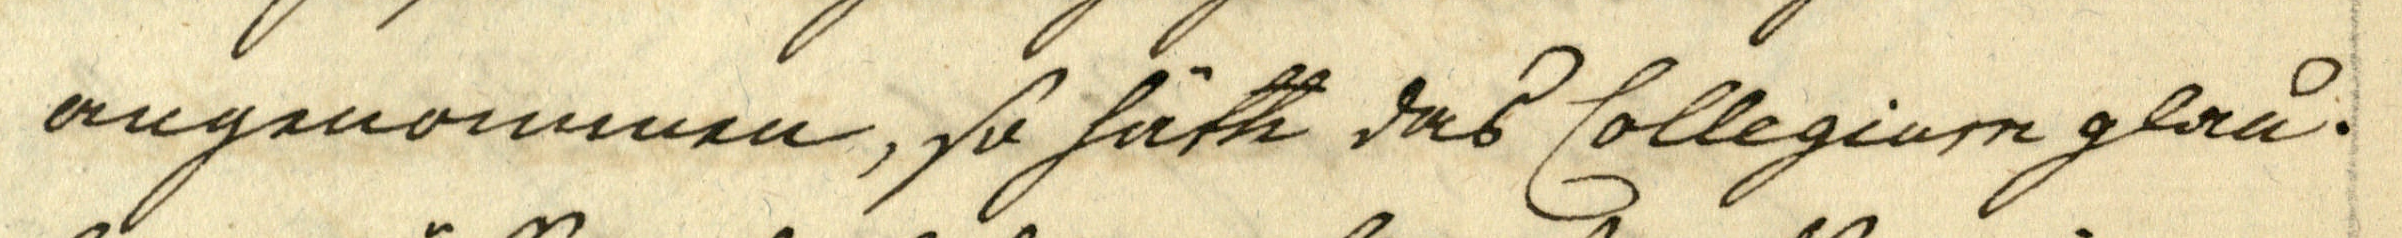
angenommen, so hätte das Collegium glau¬
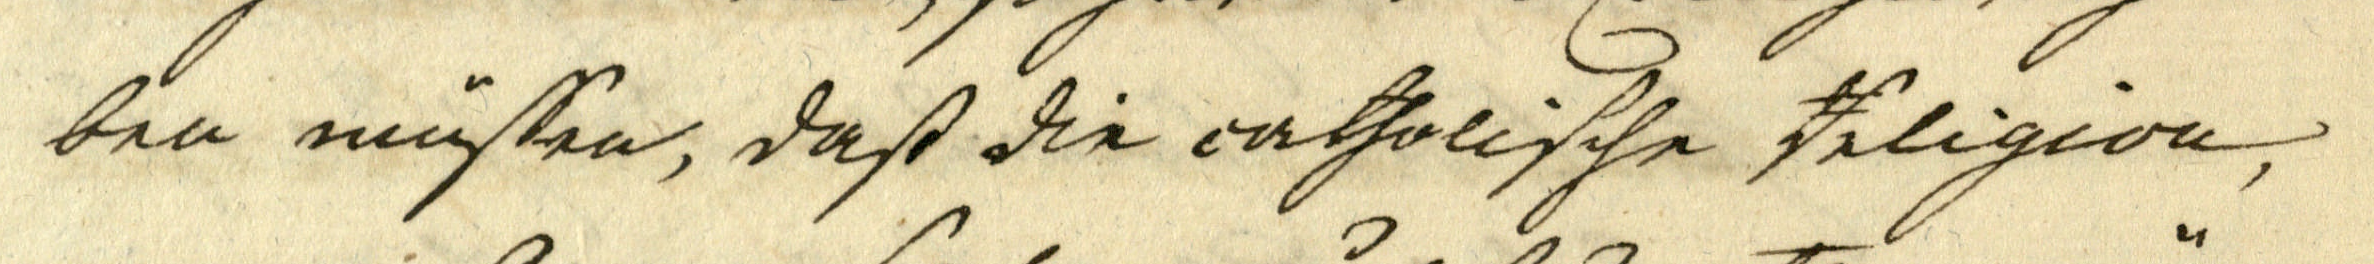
ben müssen, daß die catholische Religion,
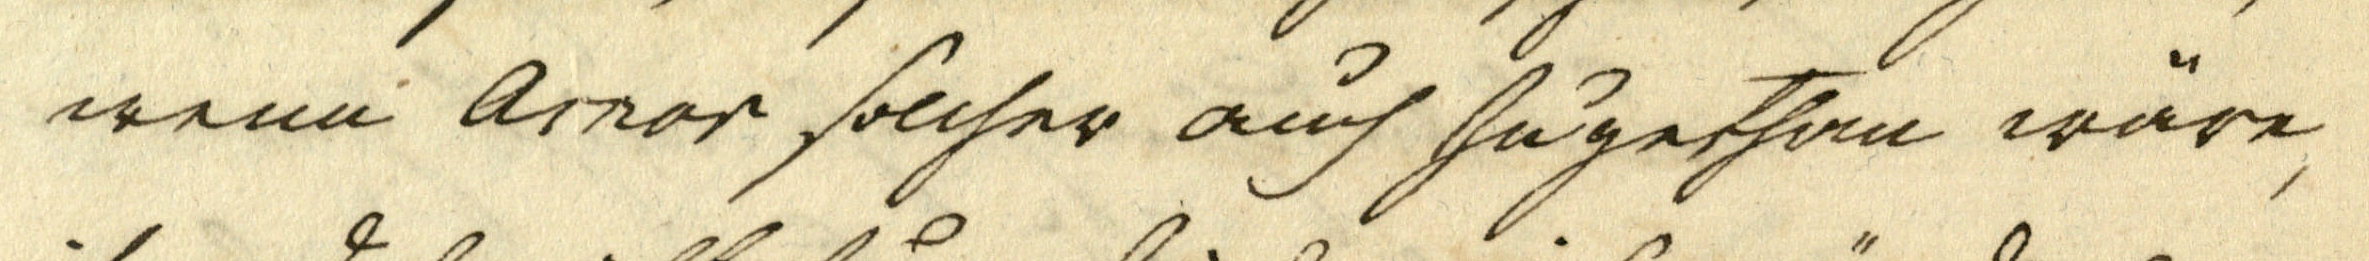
wenn Amor solcher auch zugethan wäre,
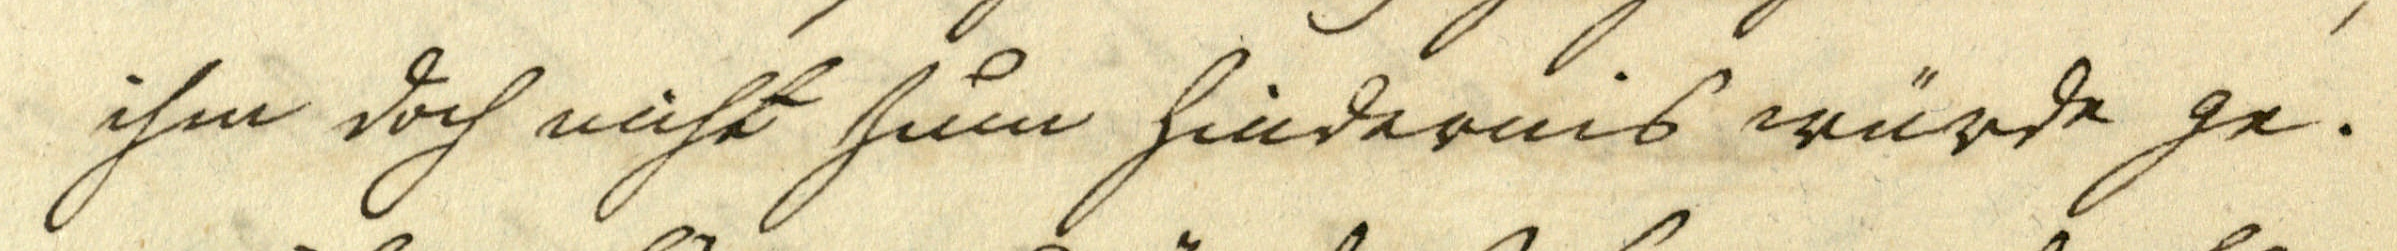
ihm doch nicht zum Hindernis würde ge¬
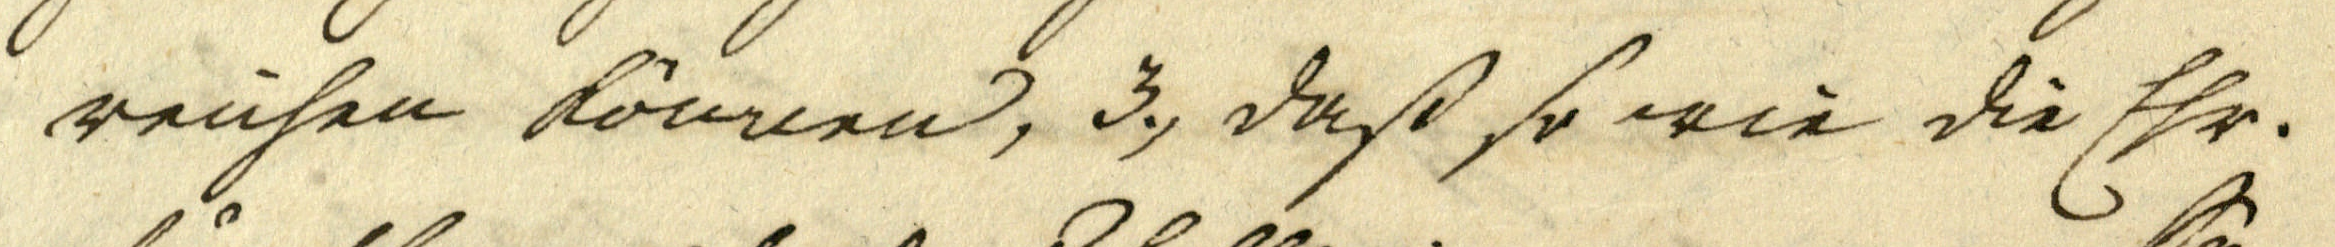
reichen können, 3., daß so wie die Ehr¬
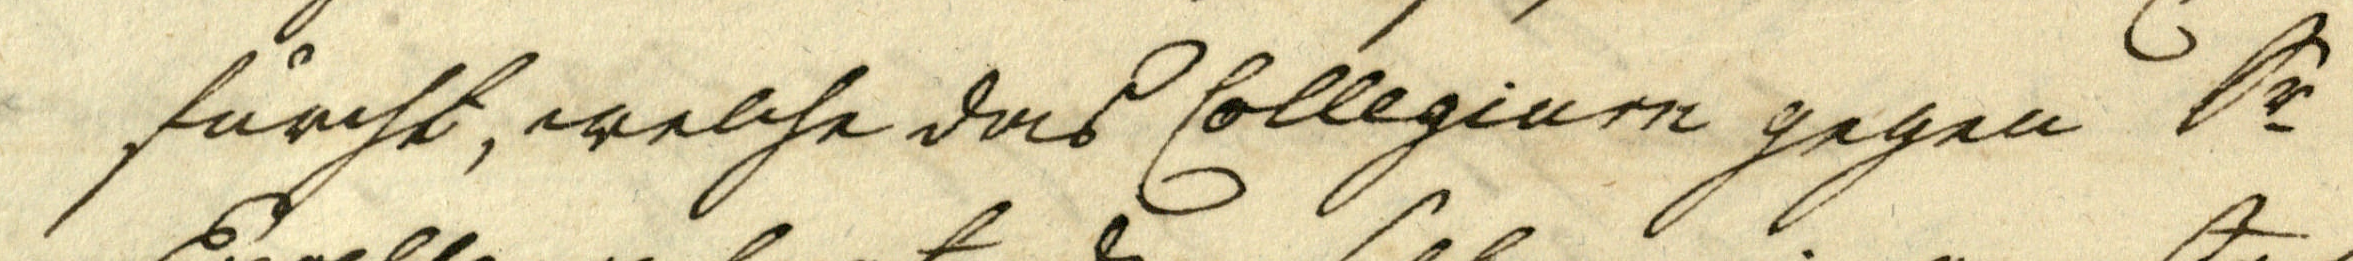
furcht, welche das Collegium gegen Sr
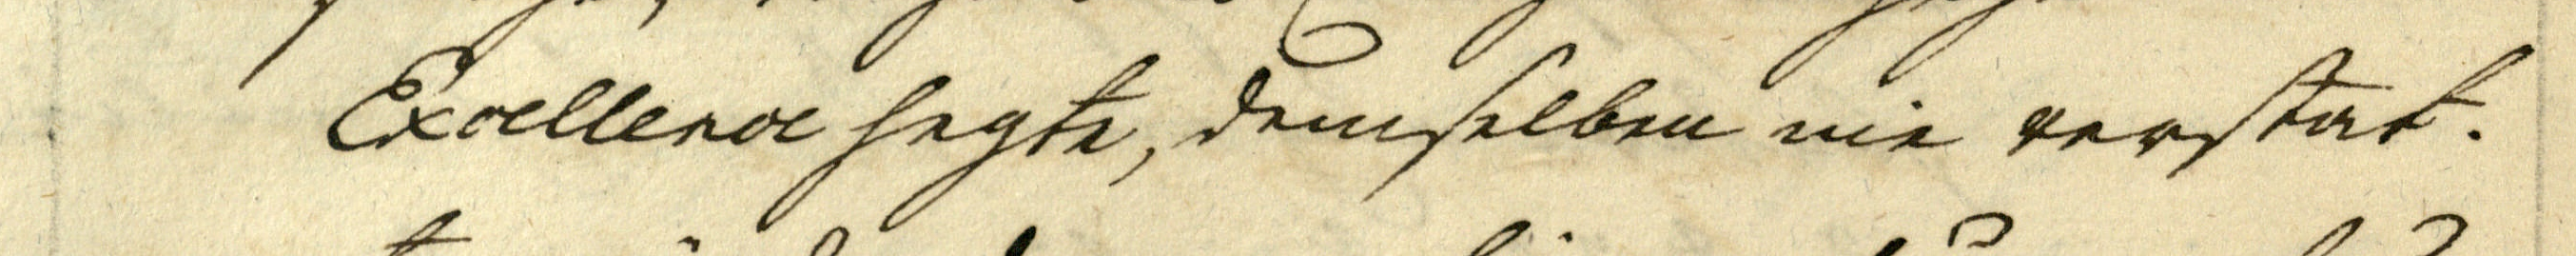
Excellence hegte, demselben nie verstat¬
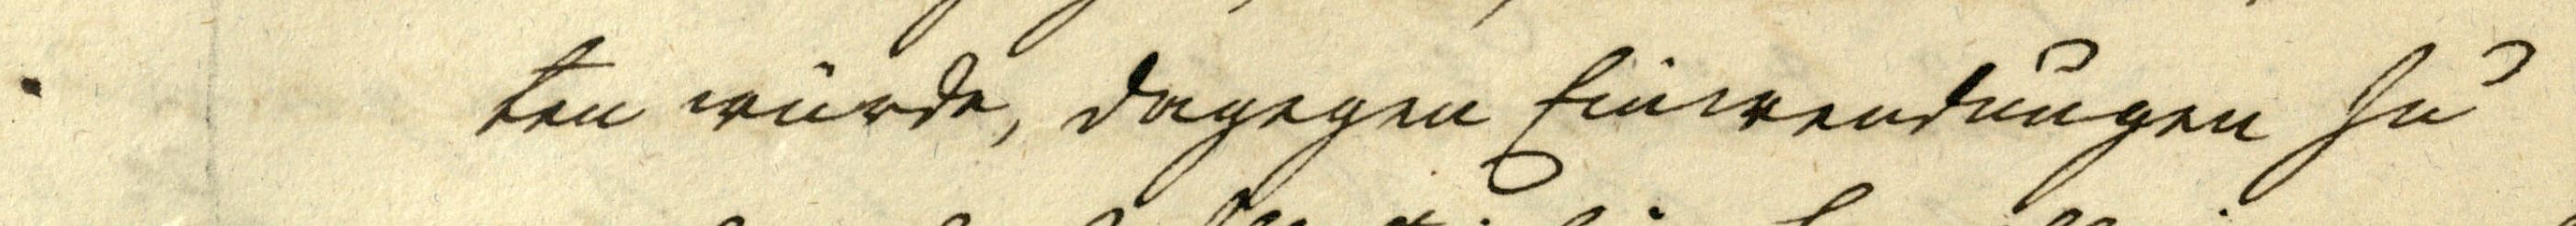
ten würde, dagegen Einwendunngen zu
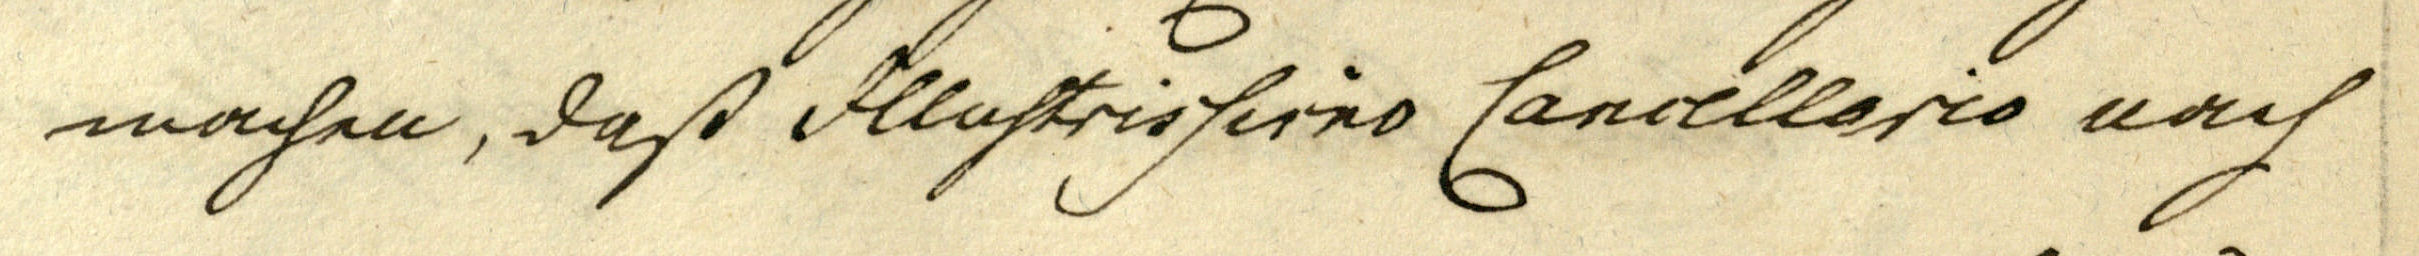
machen, daß Illustrissimo Cancellario nach
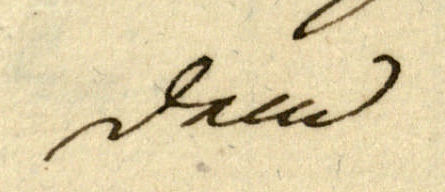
dem
